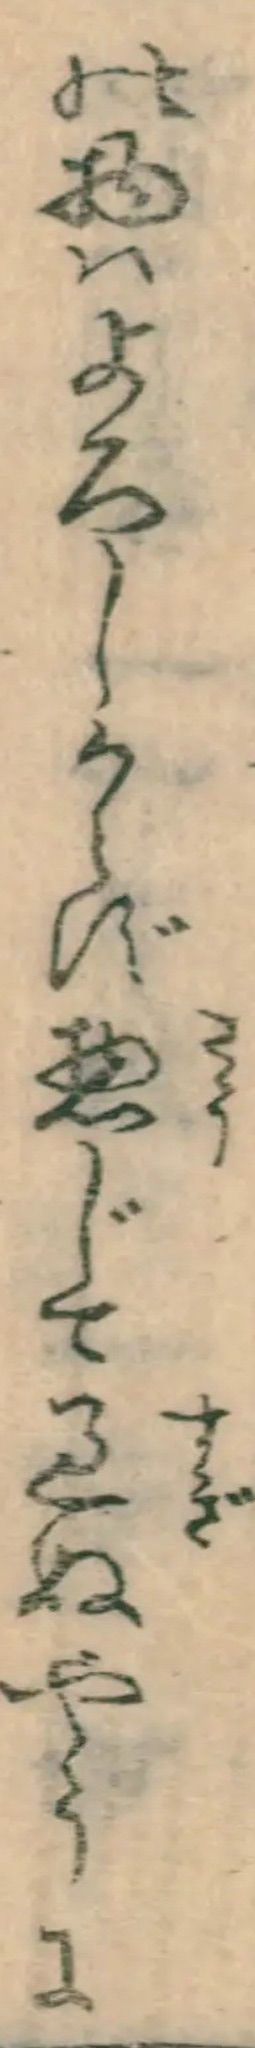の物はよろしからず惣じて過ぬやうに
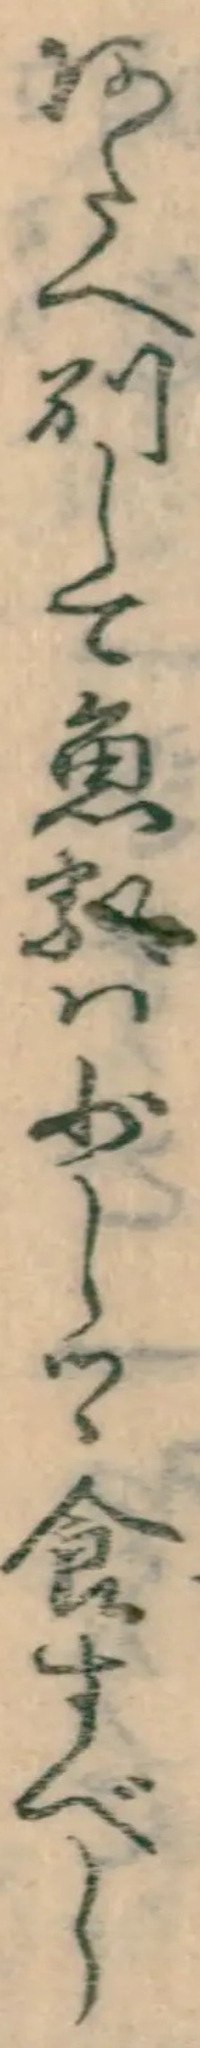あたへ別して魚類は少しつゝ食すべし
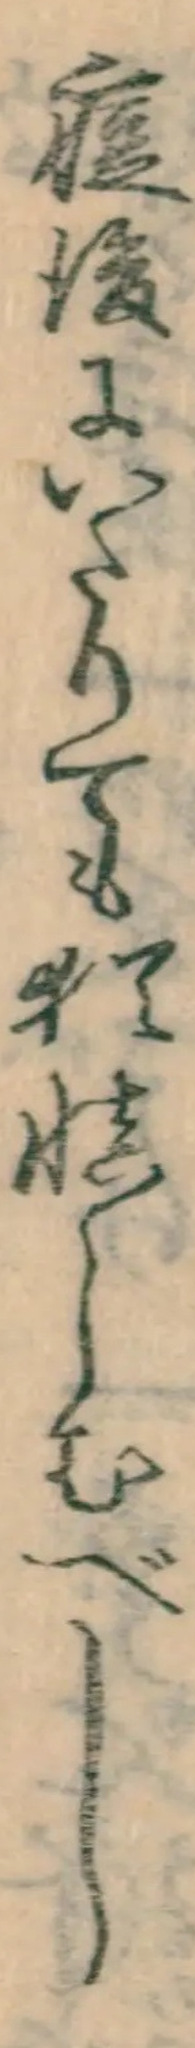痘後にいたりても猶慎しむべし
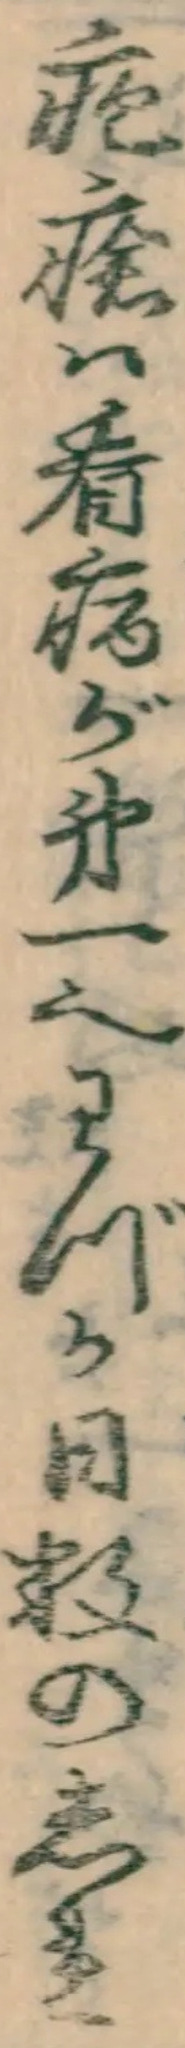疱瘡は看病が第一也わづか日数のしれ
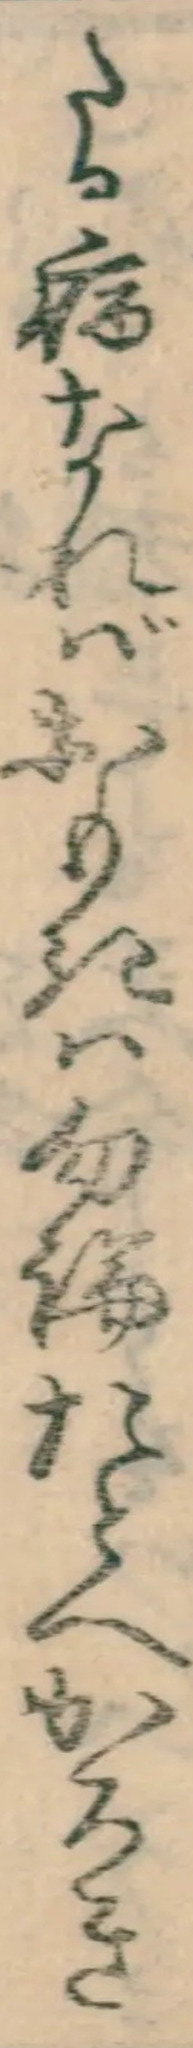たる病なればおもきは勿論たとへかろき
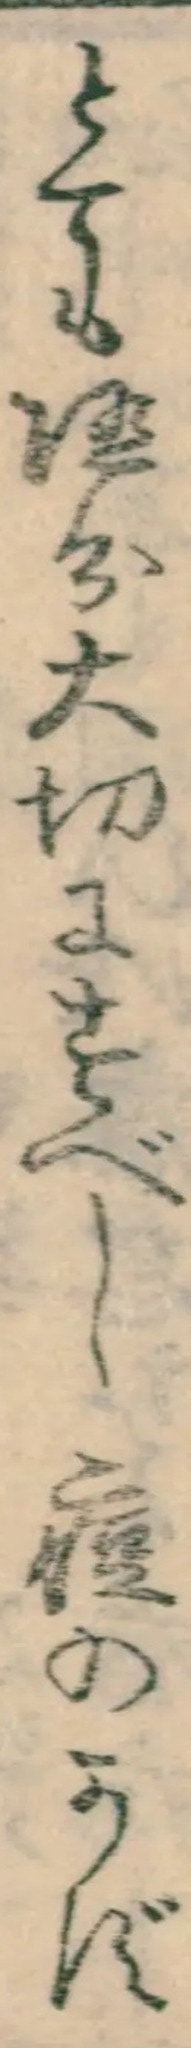とても随分大切にすべし痘のかず
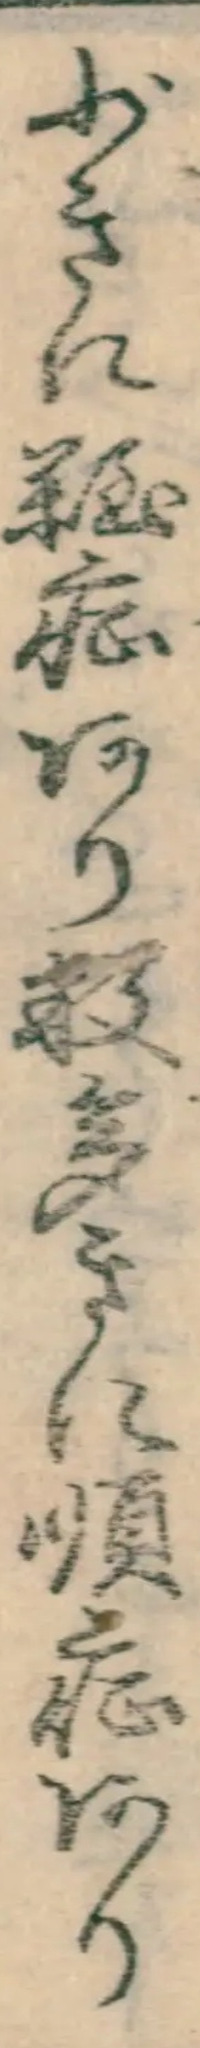少きに難症あり数多きに順症あり
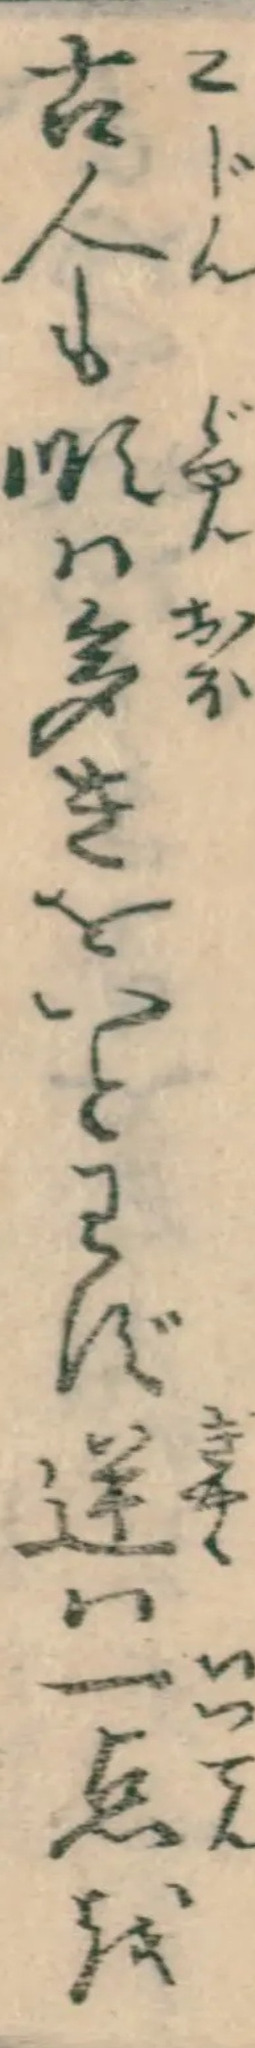古人も順は多きをいとわず逆は一点を
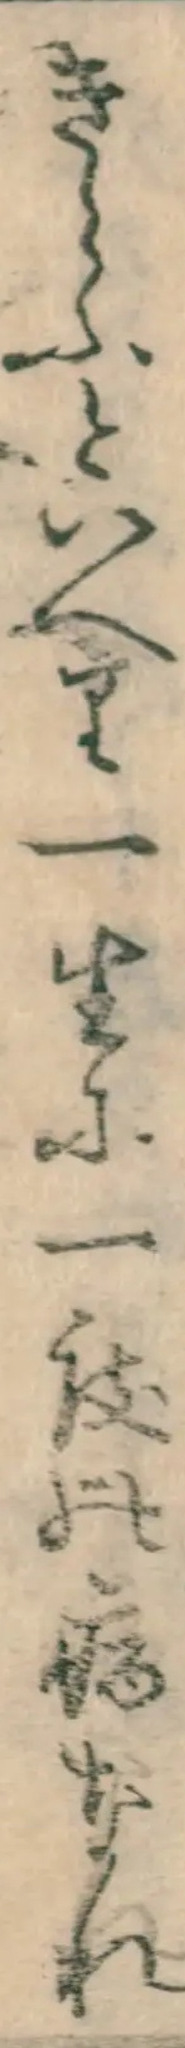きらふといへり一生に一度の病なれ
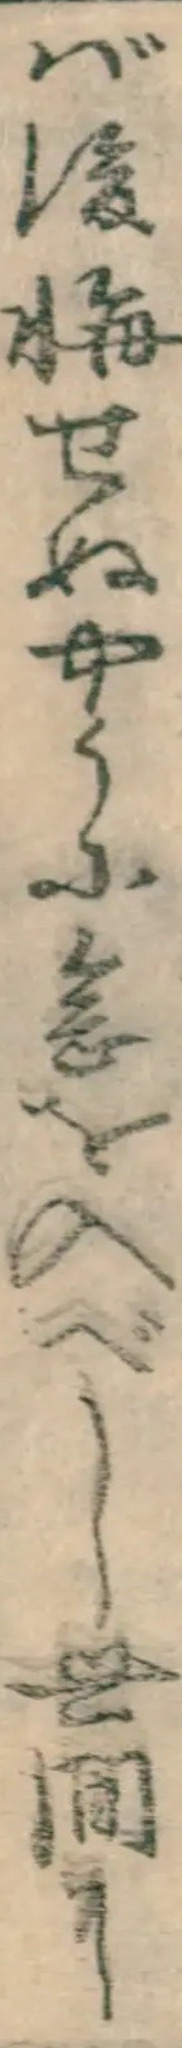ば後悔せぬやうに念を入べし世間に

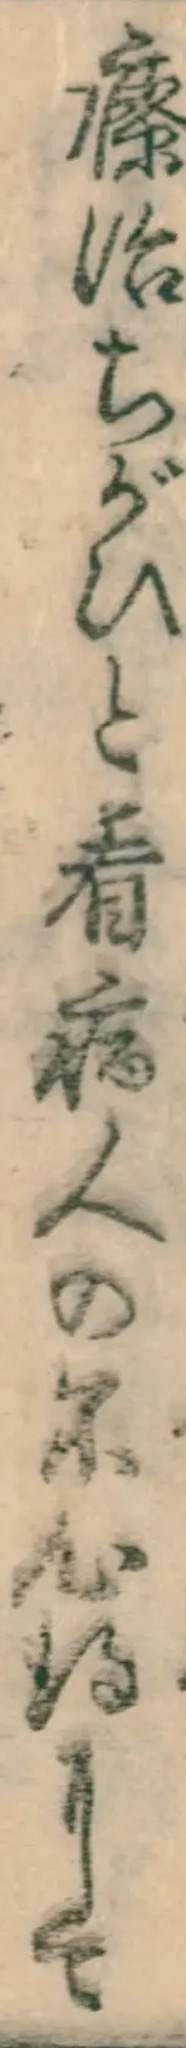療治ちがひと看病人の不心得にて
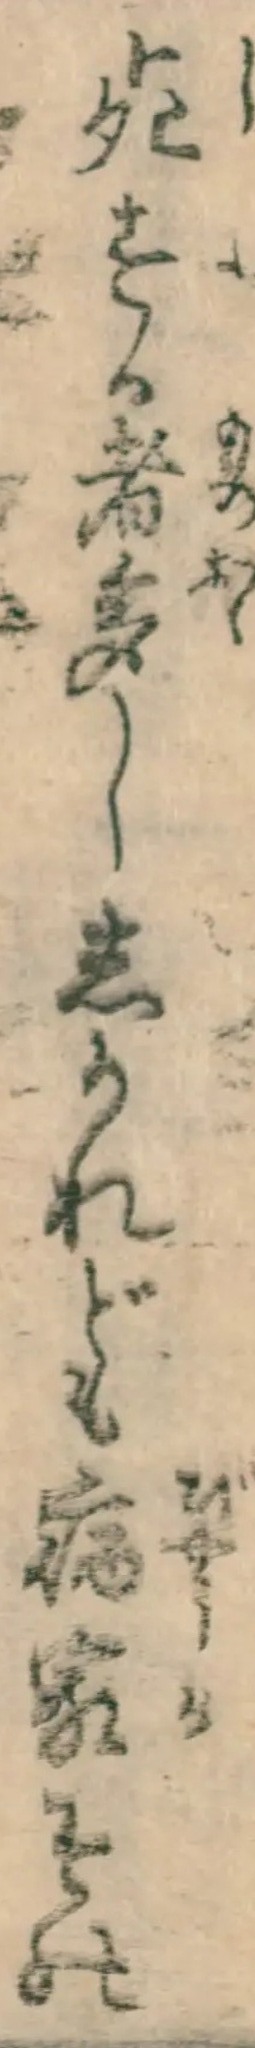死する者多ししかれども病家その
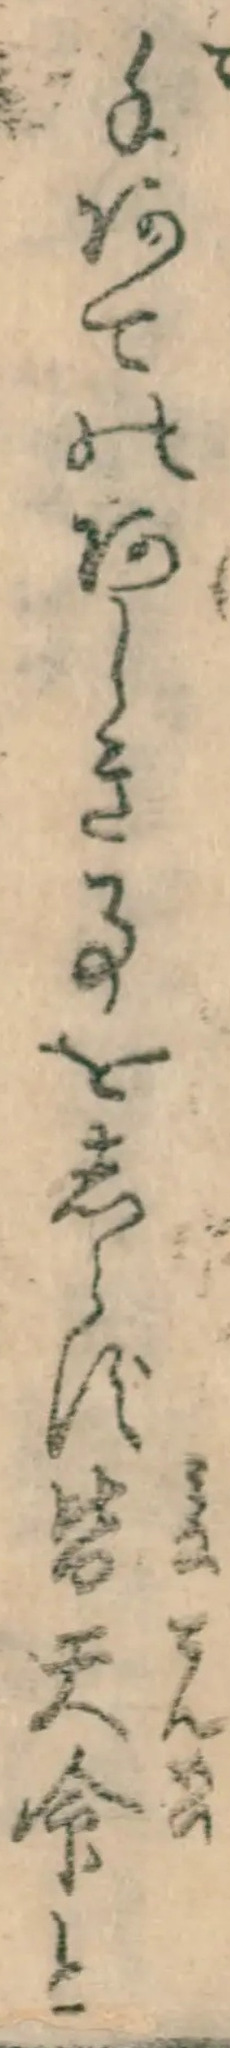手あてのあしき事をしらず皆天命と
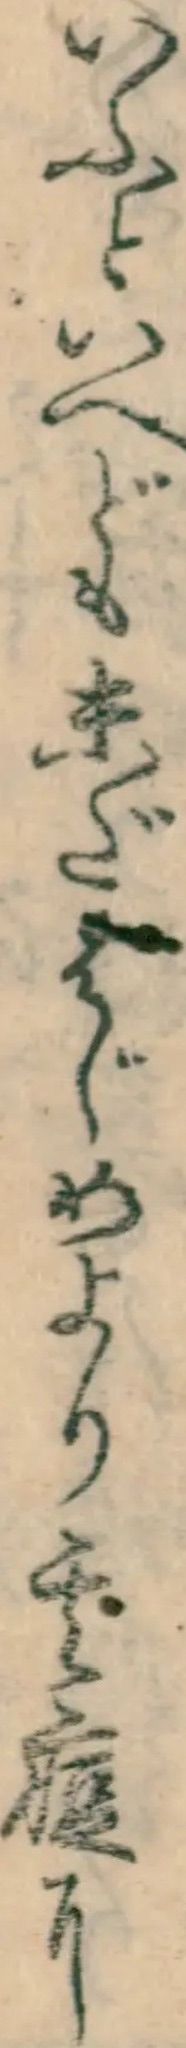いふといへども未だはじめより其痘に
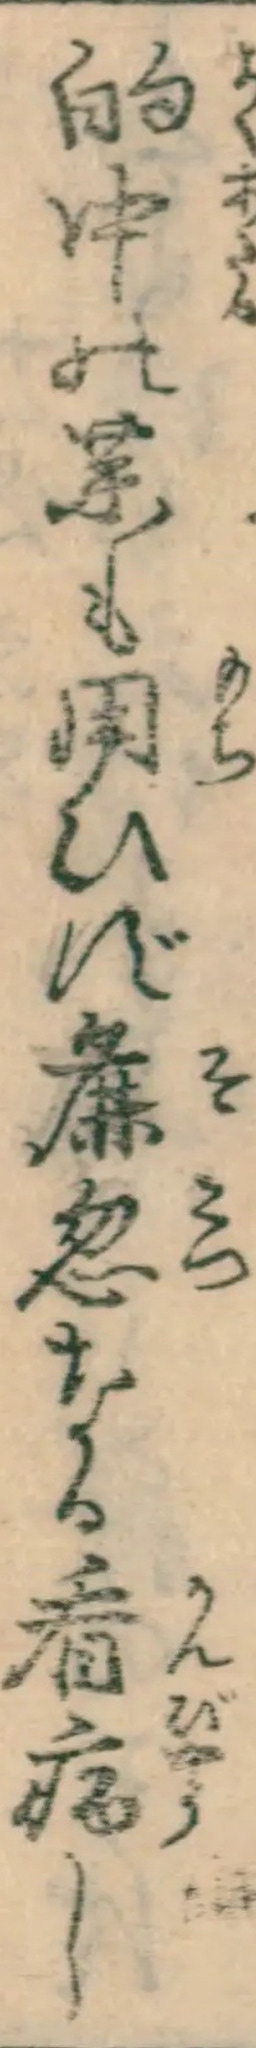的中の薬も用ひず麤忽なる看病し
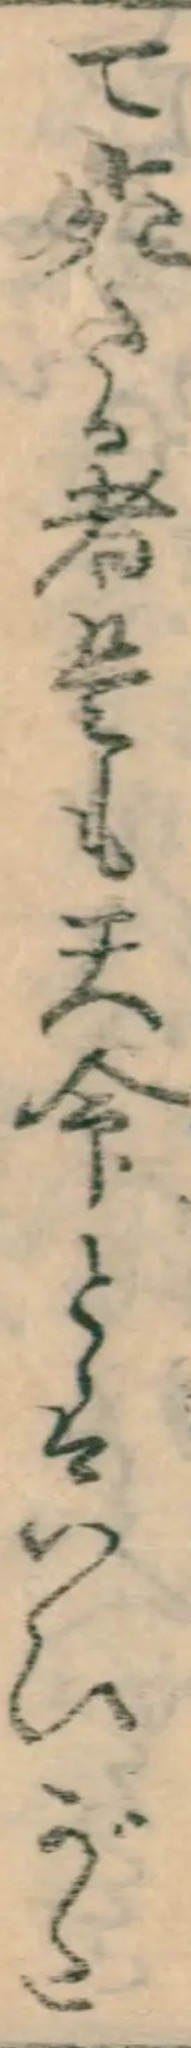て死たる者是も天命とはいひがた
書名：疱瘡能毒記
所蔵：国立国会図書館 National Diet Library, JAPAN
